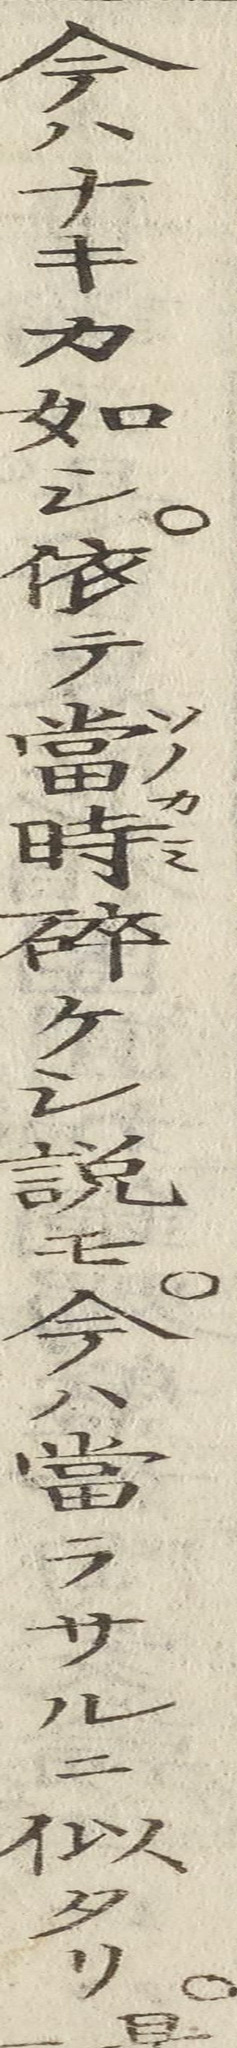今ハナキカ如シ。依テ当時碎ケシ説モ。今ハ当ラサルニ似タリ。是二
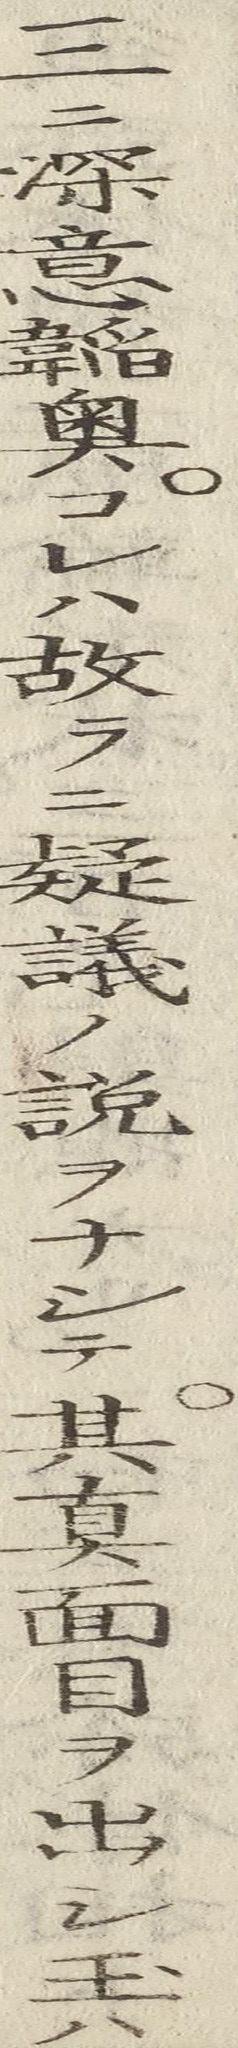三ニ深意韜奥。コレハ故ラニ疑議ノ説ヲナシテ。其真面目ヲ出シ玉ハ
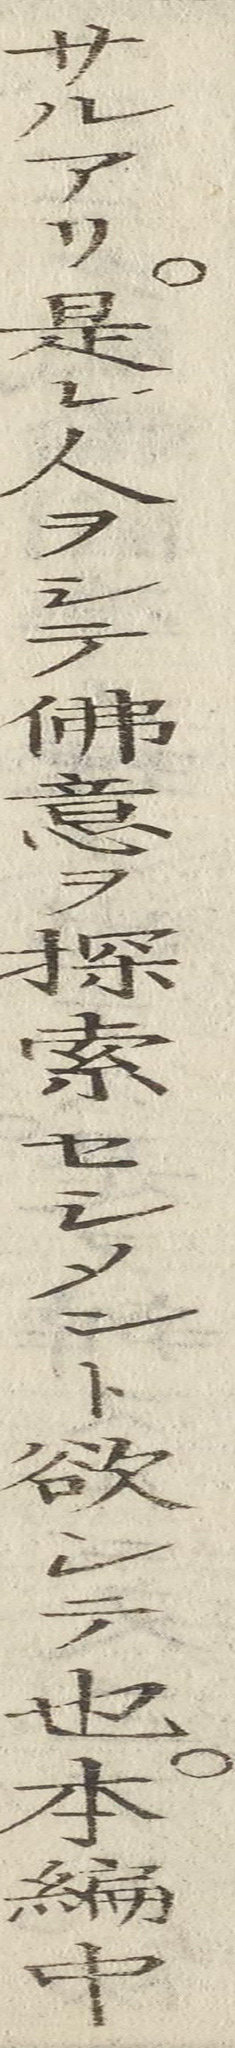サルアリ。是レ人ヲシテ仏意ヲ探索セシメント欲シテ也。本編中
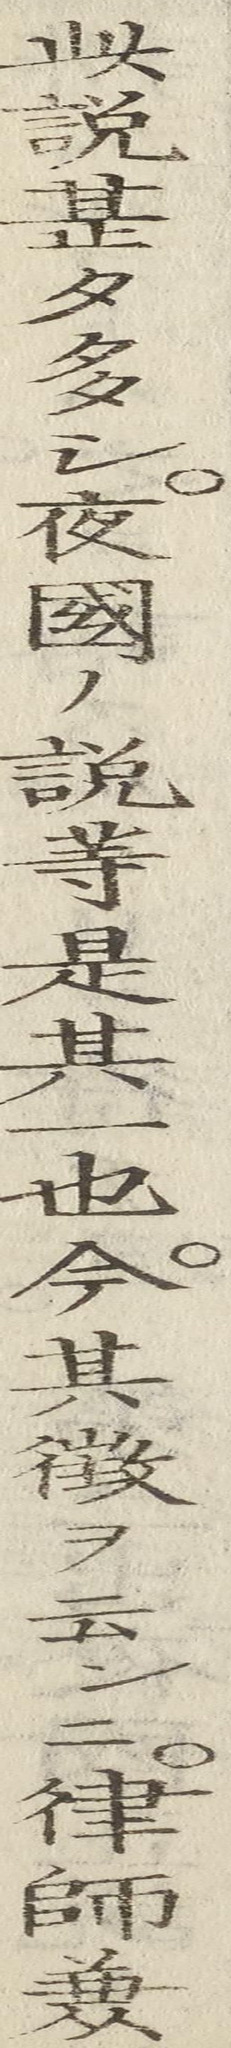此説甚タ多シ。夜国ノ説等是其一也。今其徴ヲ云ンニ。律師兼
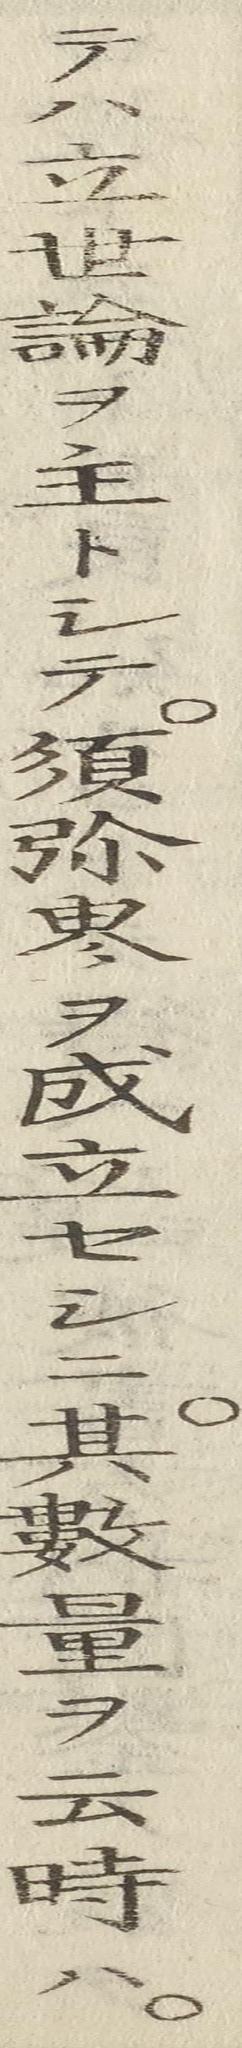テハ立世論ヲ主トシテ。須弥界ヲ成立セシニ。其数量ヲ云時ハ。
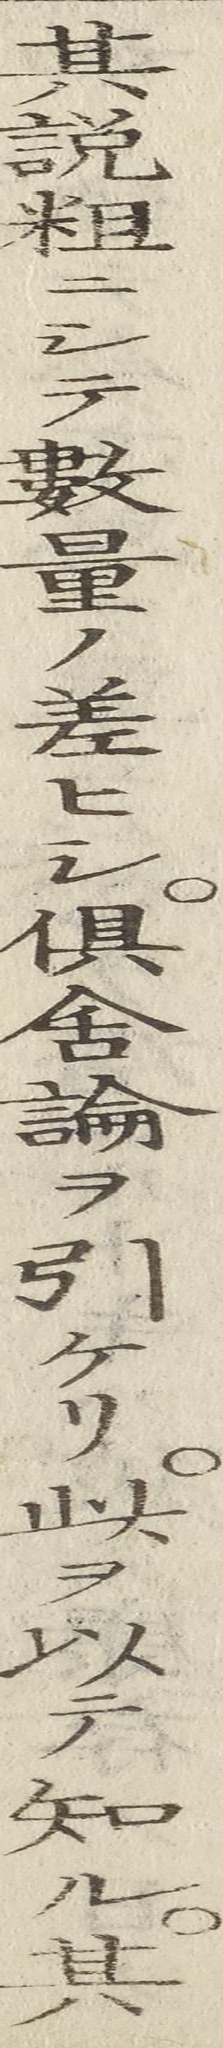其説粗ニシテ数量ノ差ヒシ。俱舎論ヲ引ケリ。此ヲ以テ知ル。其
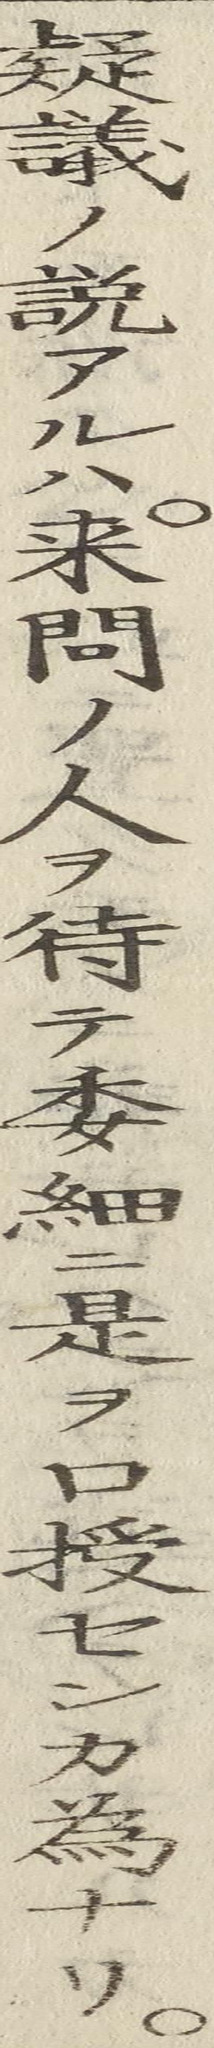疑議ノ説アルハ。来問ノ人ヲ待テ委細ニ是ヲ口授センカ為ナリ。

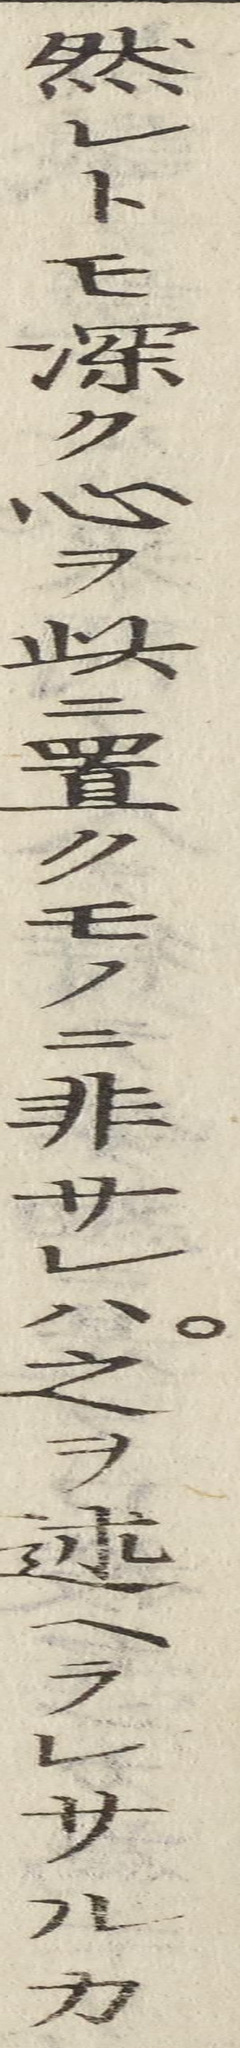然レトモ深ク心ヲ此ニ置クモノニ非サレハ。之ヲ述ヘラレサルカ
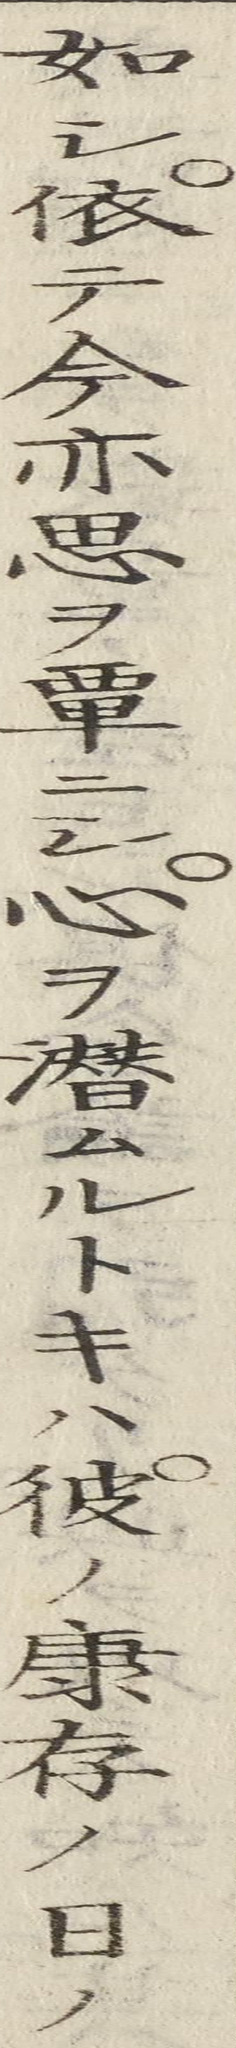如シ。依テ今亦思フ覃ニシ。心ヲ潜ムルトキハ。彼ノ康存ノ日ノ
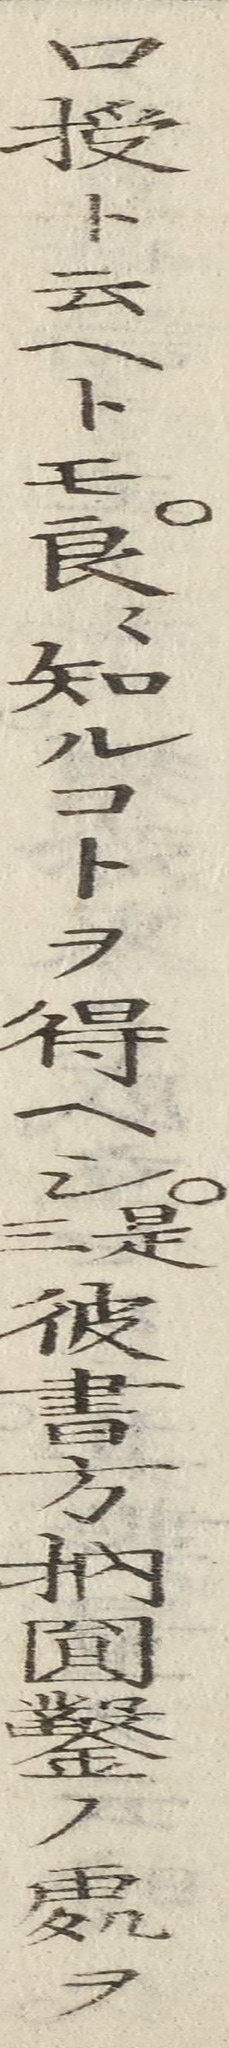口授ト云ヘトモ。良〱知ルコトヲ得ヘシ。是三彼書方抐円鑿ノ処ヲ
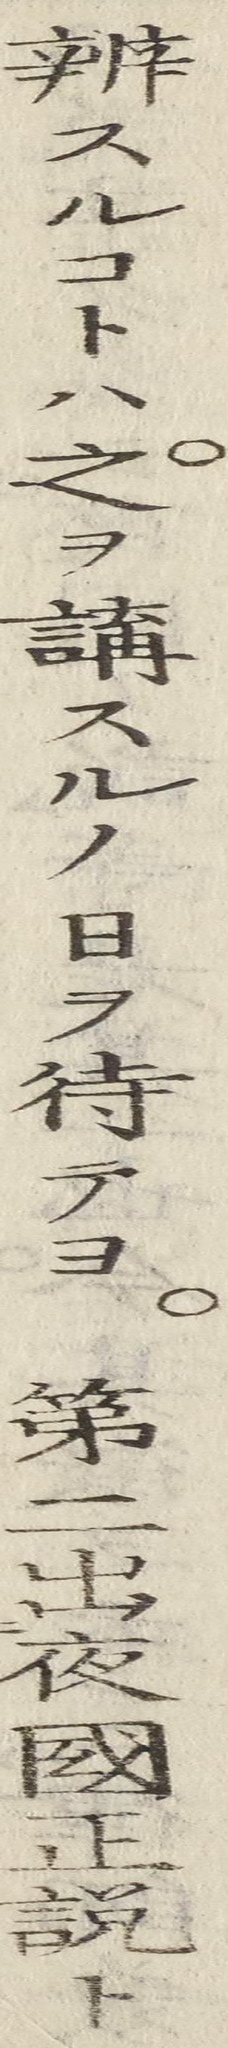弁スルコトハ。之ヲ講スルノ日ヲ待テヨ。第ニ出ニ夜国正説ト
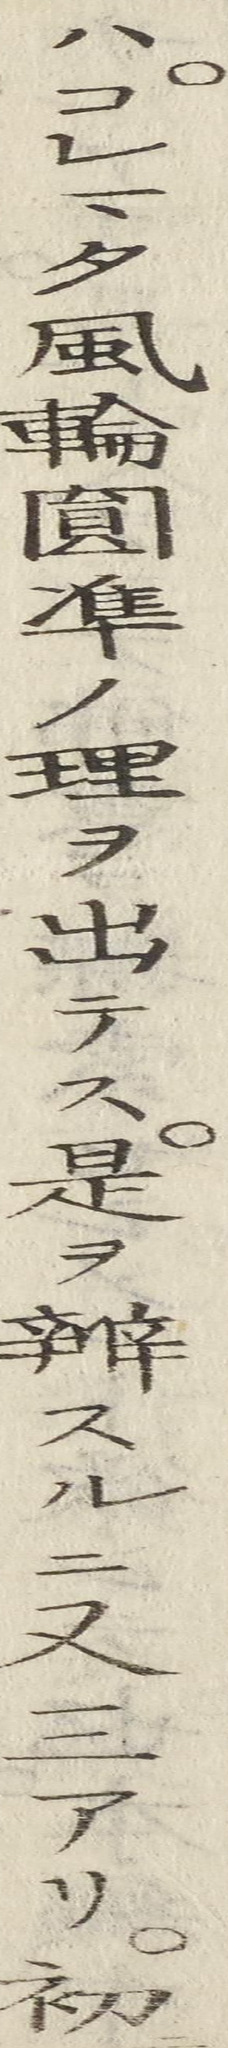ハ。コレマタ風輪円準ノ理ヲ出テス。是ヲ弁スルニ又三アリ。初
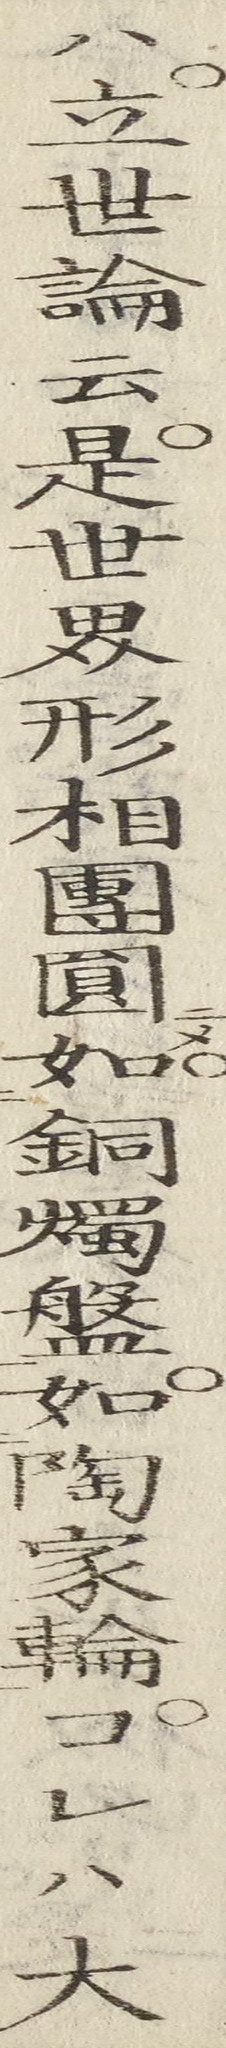ハ。立世論云。是世界形相団円。如ニ銅燭盤。如ニ陶家輪。コレハ大
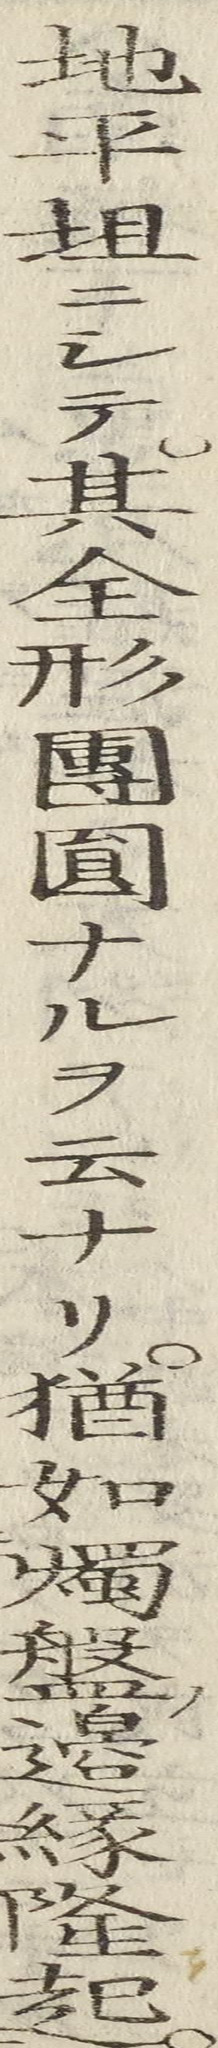地平坦ニシテ。其全形団円ナルヲ云ナリ。猶如ニ燭盤辺縁隆起。
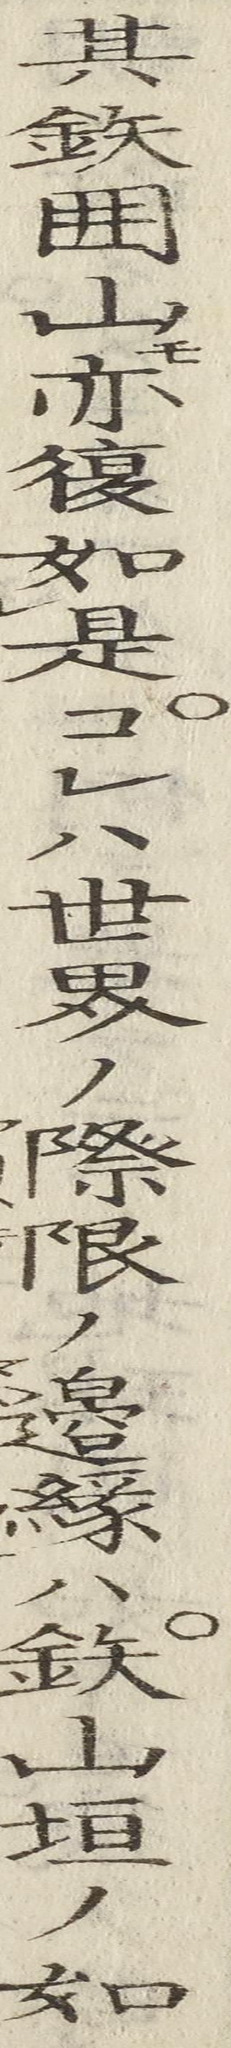其鉄囲山亦復如是。コレハ世界ノ際限ノ辺縁ハ。鉄山垣ノ如
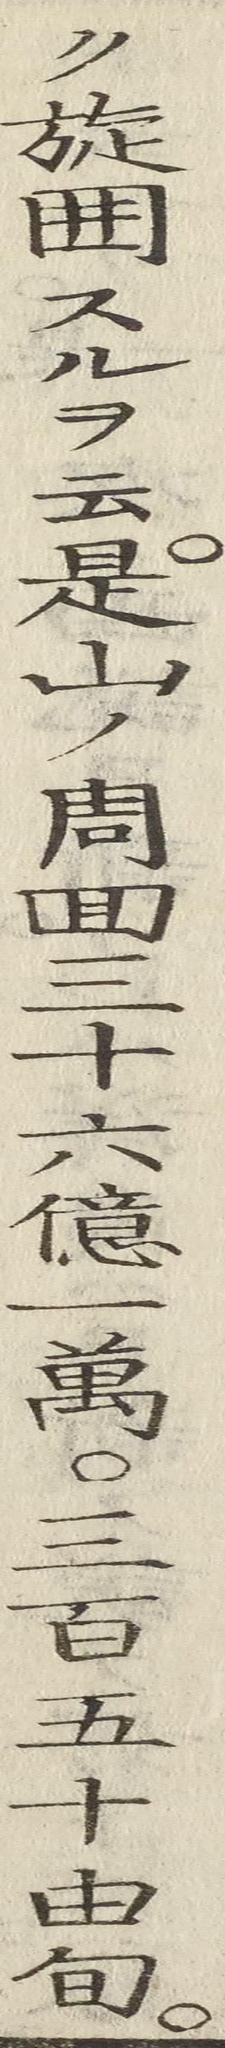ク旋囲スルヲ云。是山ノ周囲三十六億一万〇三百五十由旬。
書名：護法新論　二編　上
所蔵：東京大学地震研究所図書室 Earthquake Research Institute Library, The University of Tokyo, JAPAN
